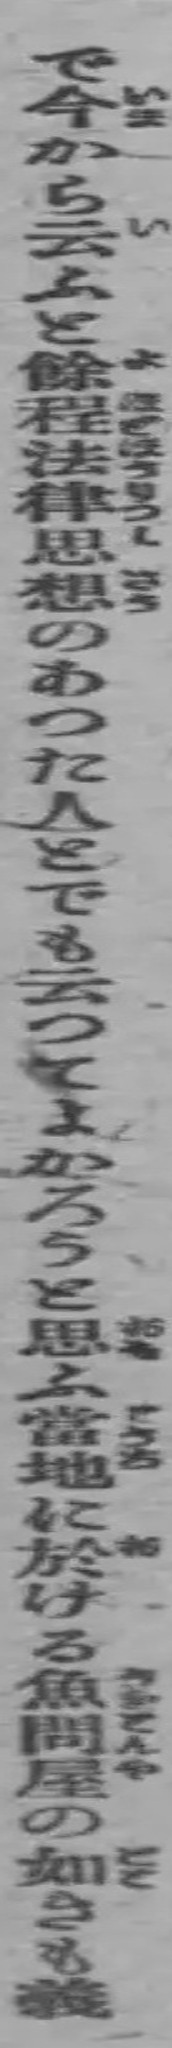で今から云ふと余程法律思想のあつた人とでも云つてよかろうと思ふ当地に於ける魚問屋の如きも義

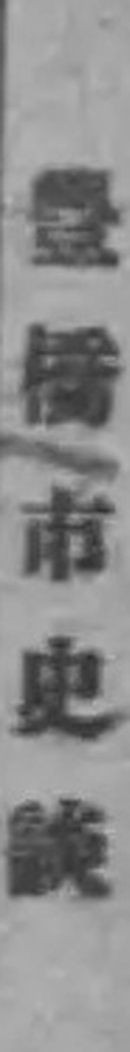豊橋市史談
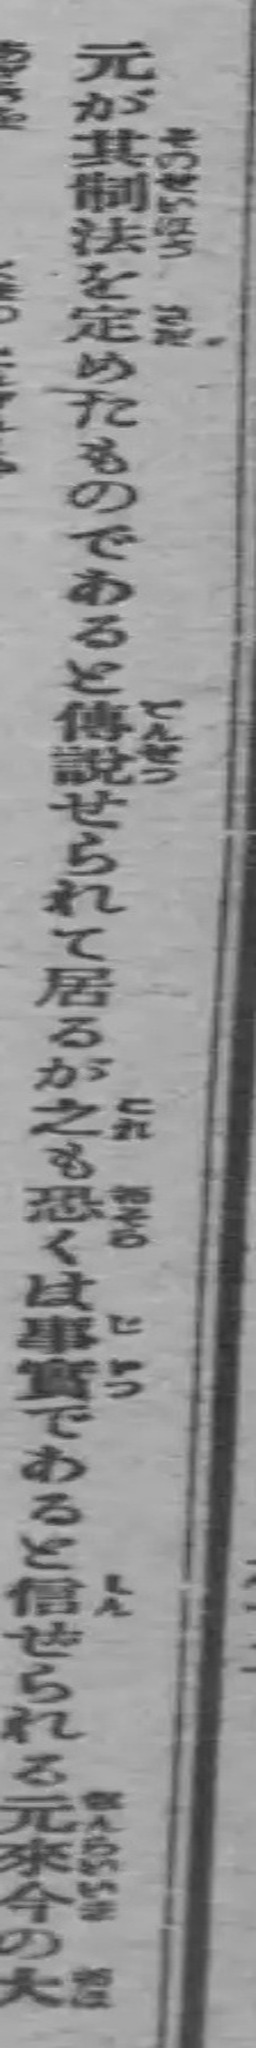元が其制法を定めたものであると伝説せられて居るが之も恐くは事実であると信ぜられる元来今の大
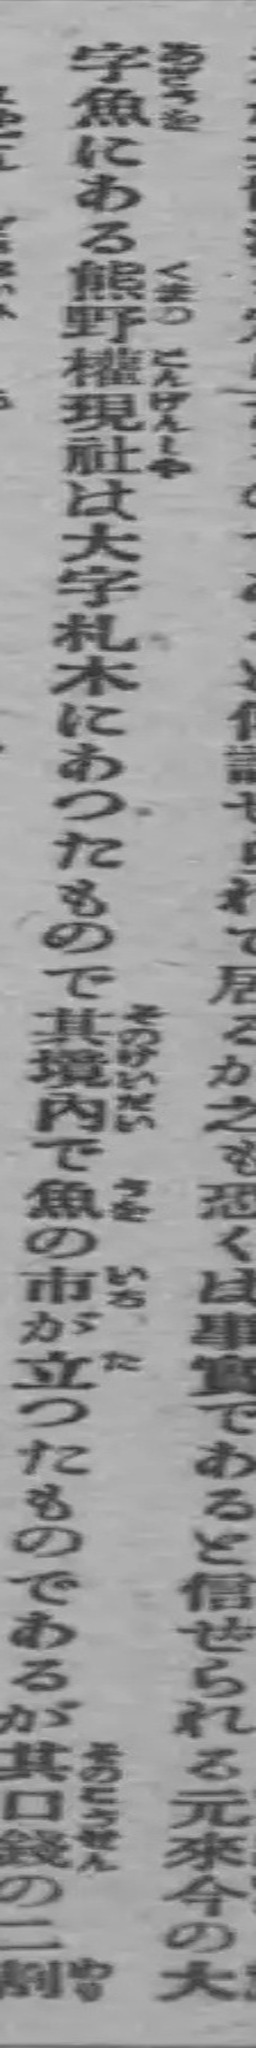魚問屋字魚にある熊野権現社は大字札木にあつたものでその其境内で魚の市が立つたものであるが其口銭の二割
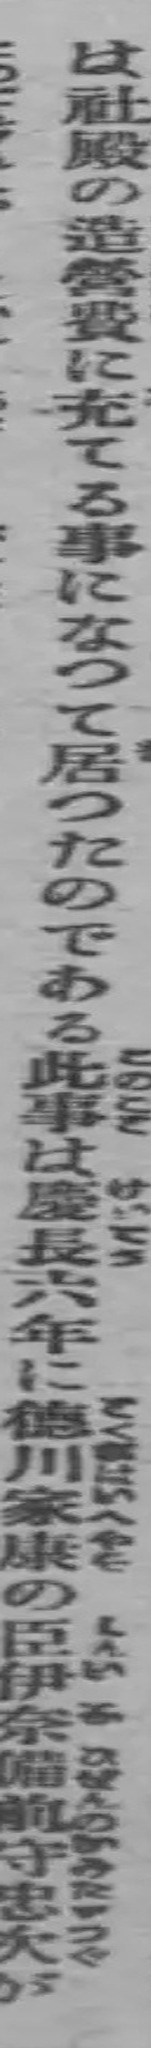は社殿の造営費に充てる事になつて居つたのである此事は慶長六年に徳川家康の臣伊奈備前守忠次が
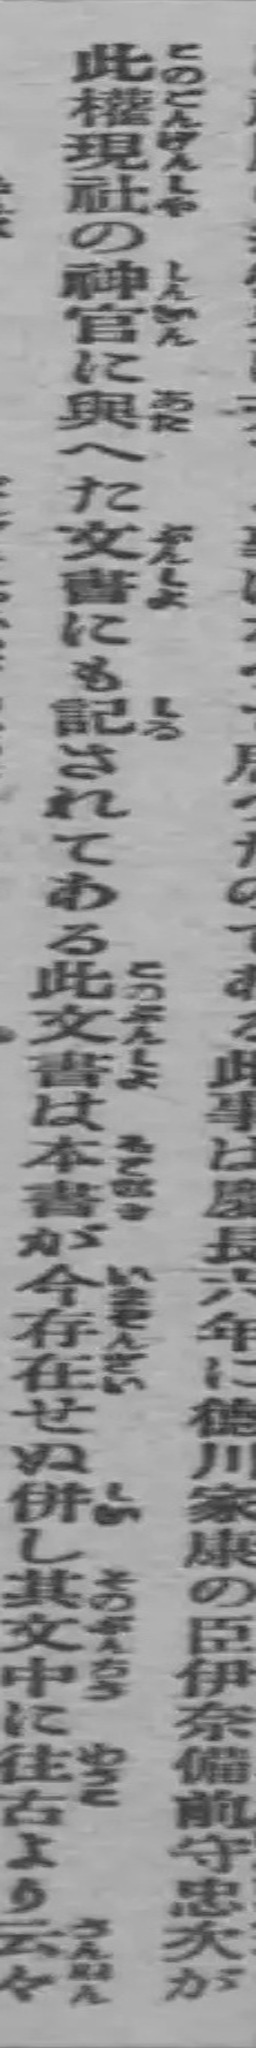此権現社の神官に与へた文書にも記されてある此文書は本書が今存在せぬ併し其文中に往古より云々
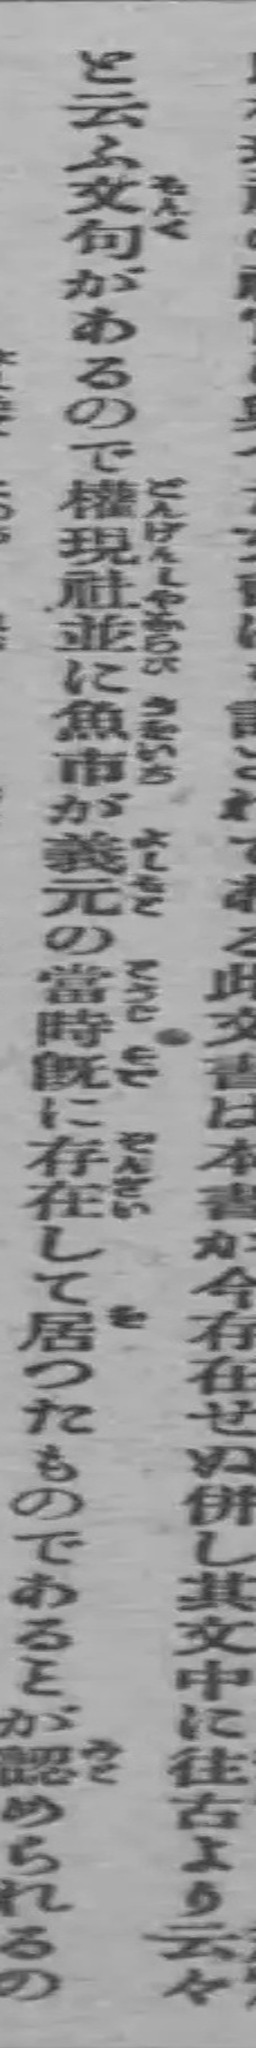と云ふ文句があるので権現社並に魚市が義元の当時既に存在して居つたものであることが認められるの
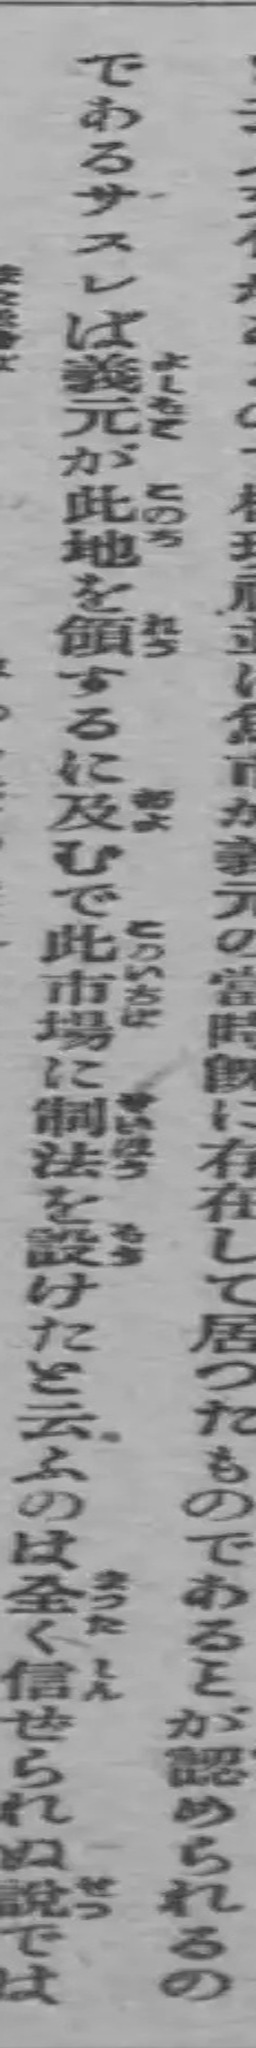であるサスレば義元が此地を領するに及むで此市場に制法を設けたと云ふのは全く信ぜられぬ説では
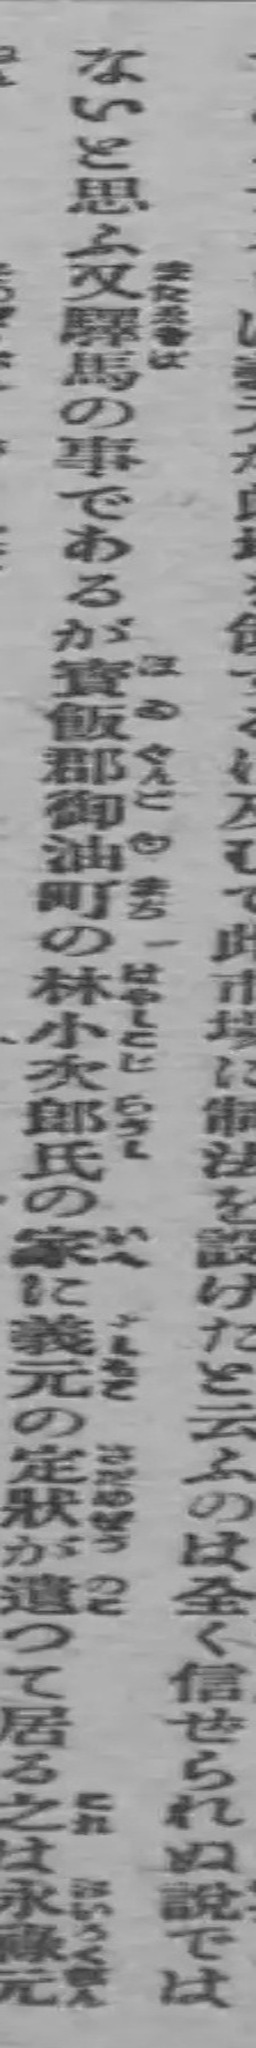ないと思ふ又駅馬の事であるが宝飯郡御油町の林小次郎氏の家に義元の定状が遺つて居る之は永禄元
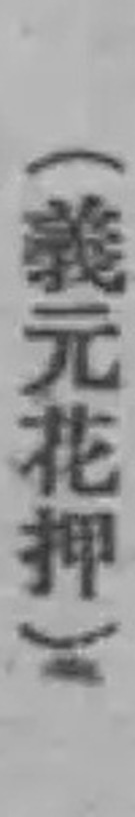(義元花押)
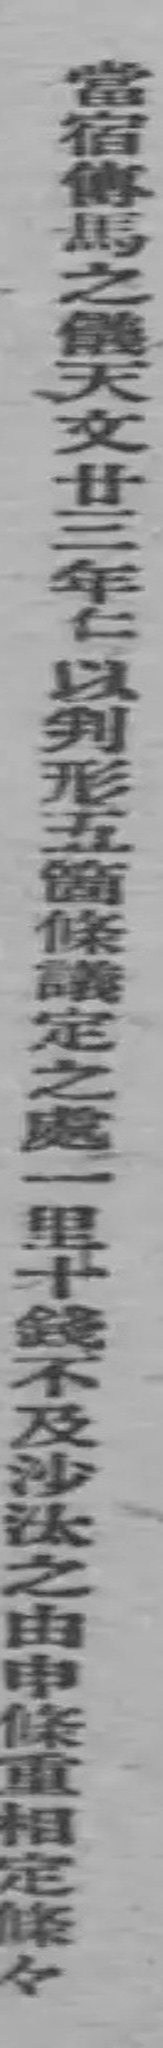当宿伝馬之儀天文廿三年仁以判形五箇條議定之処一里十銭不及沙汰之由申條重相定條々
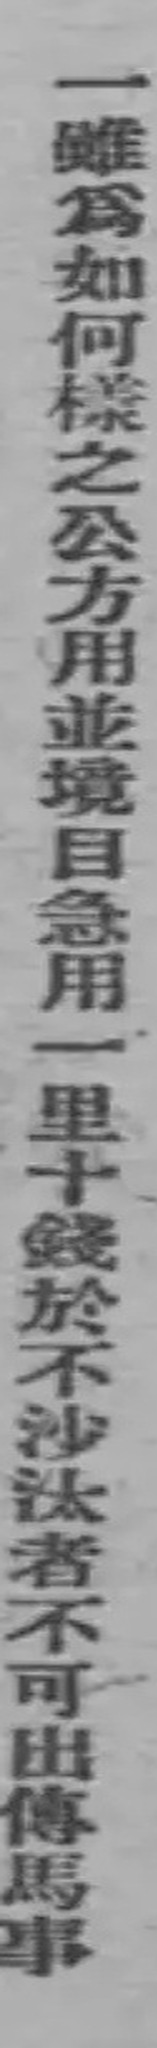一雖為如何様之公方用並境目急用一里十銭於不沙汰者不可出伝馬事
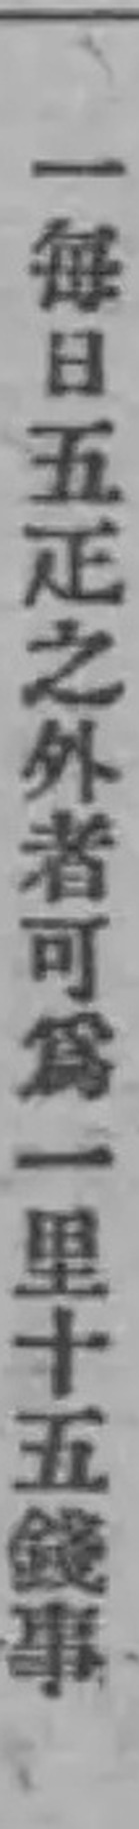一毎日五疋之外者可為一里十五銭事
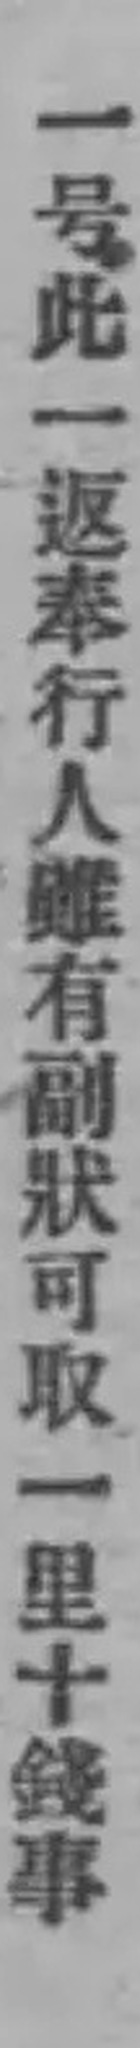一号此一返奉行人雖有副状可取一里十銭事
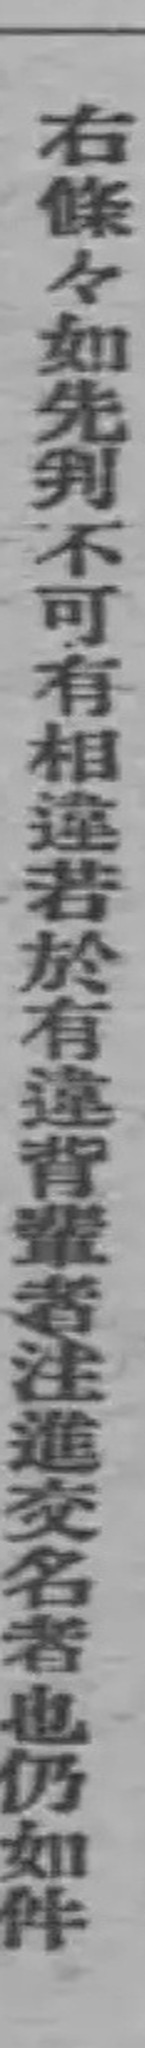右條々如先判不可有相違若於有違背輩者注進交名者也仍如件
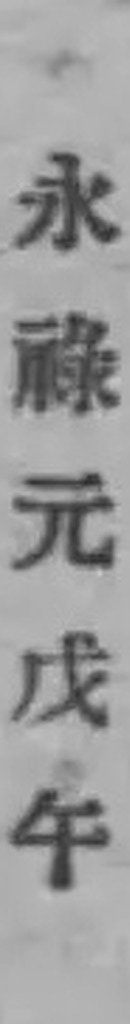永禄元戊午
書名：豊橋市史談
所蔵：国立国会図書館 National Diet Library, JAPAN
